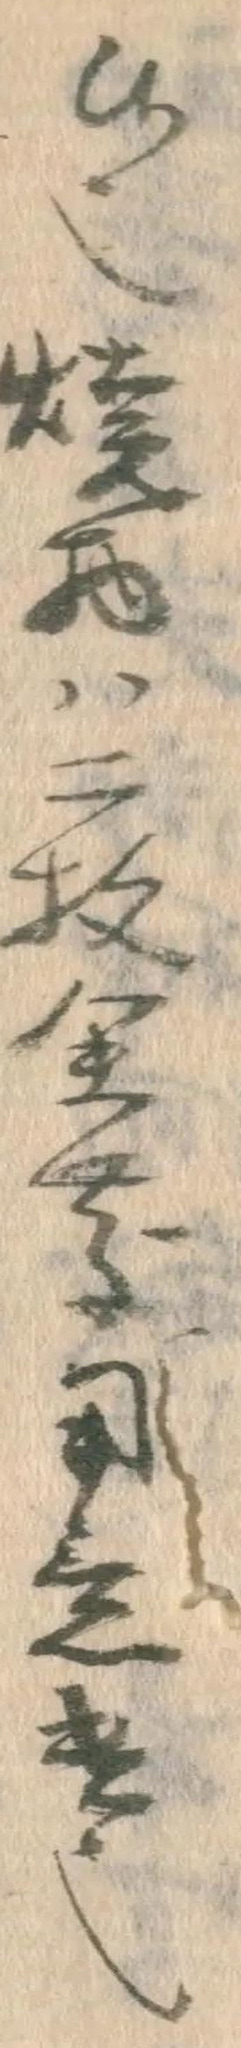候也、焼物ハ二枚余処用意遣也、
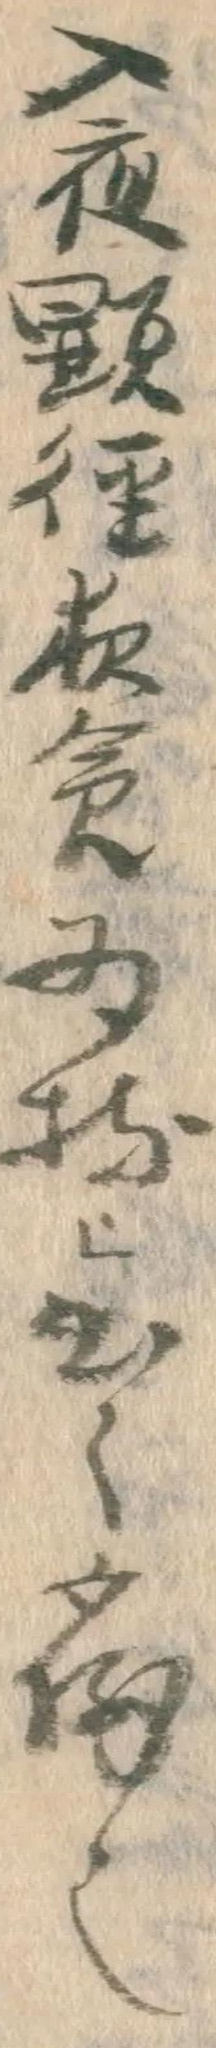入夜、顕経夜食為持被出之御例也、
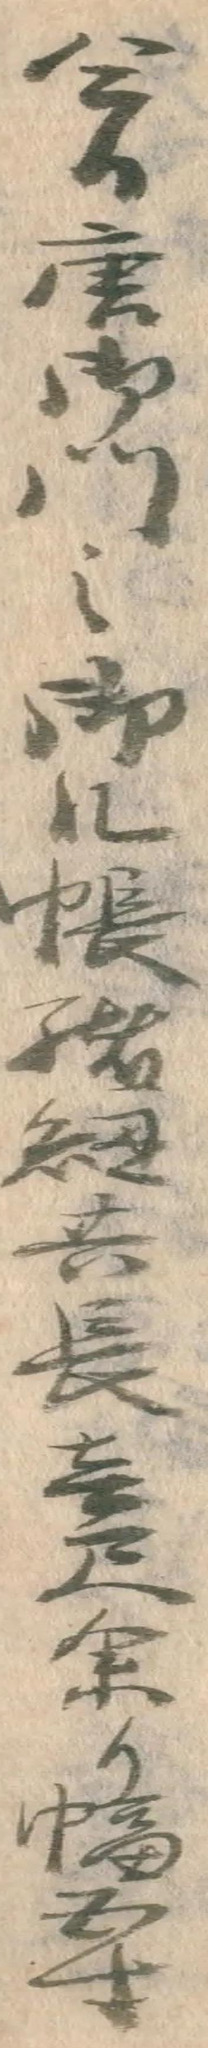今日唐御門之御几帳摺紐共長壱尺余り、幅五寸
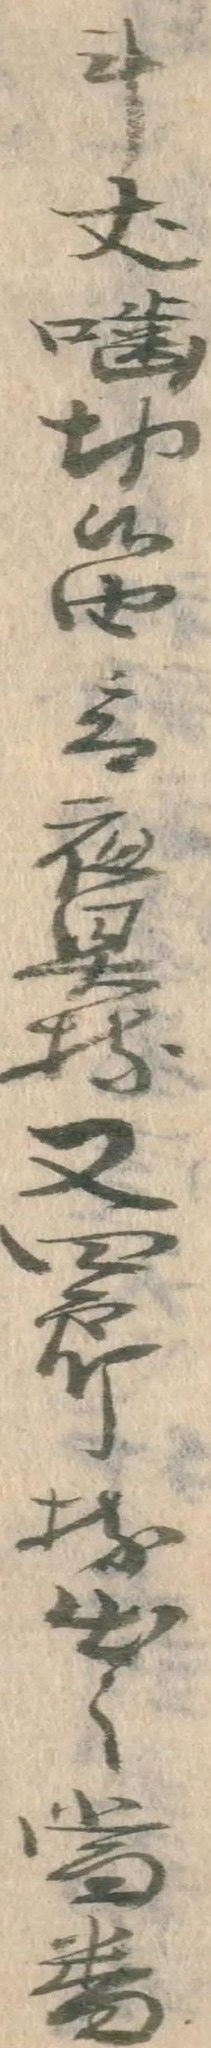計、丈噛切候由ニ而夜具持、又四郎持出し当番
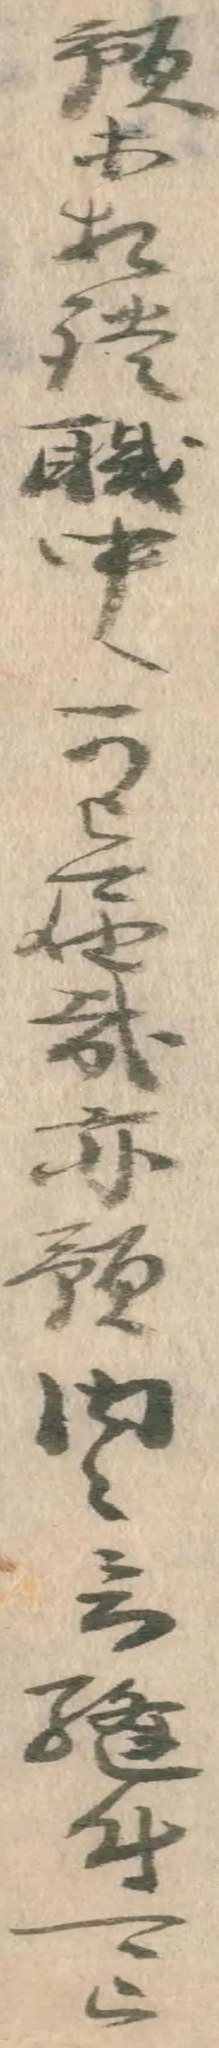預等相談、職中へ可被届哉、亦預内々ニ而縫付可被
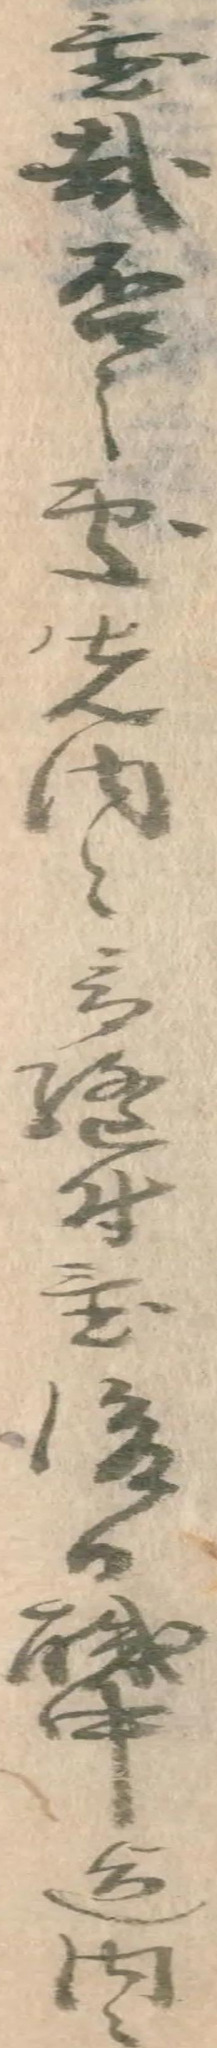置哉否之処、先内々ニ而縫付置、後日職中迄内々
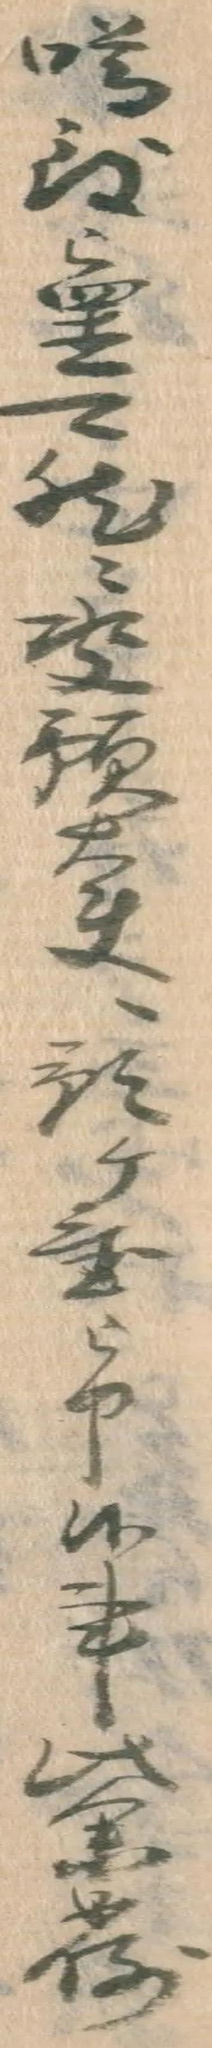噂致被置可然ニ決、預大夫へ預ケ置被申候事、此余如例、
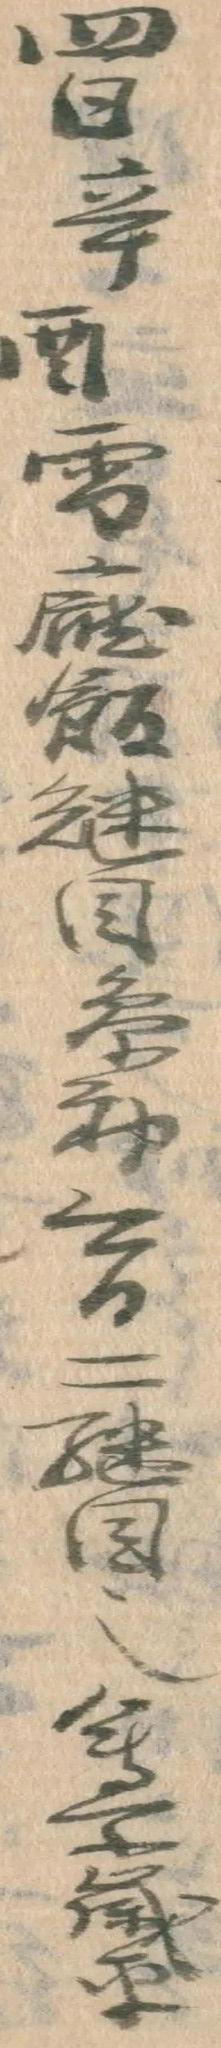四日辛酉雪、廳飯継目参勤、今日二継目也、會所歳平
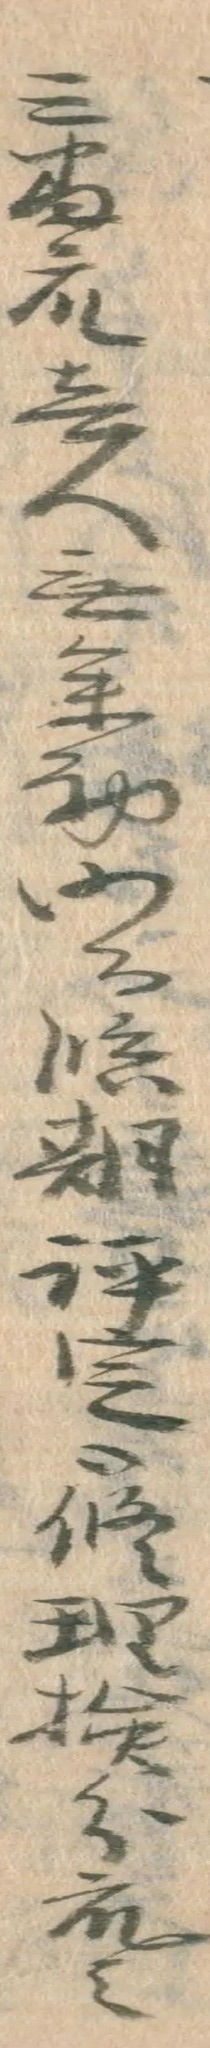三番衆壱人無参勤、仍而臨期評定御修理検分衆は
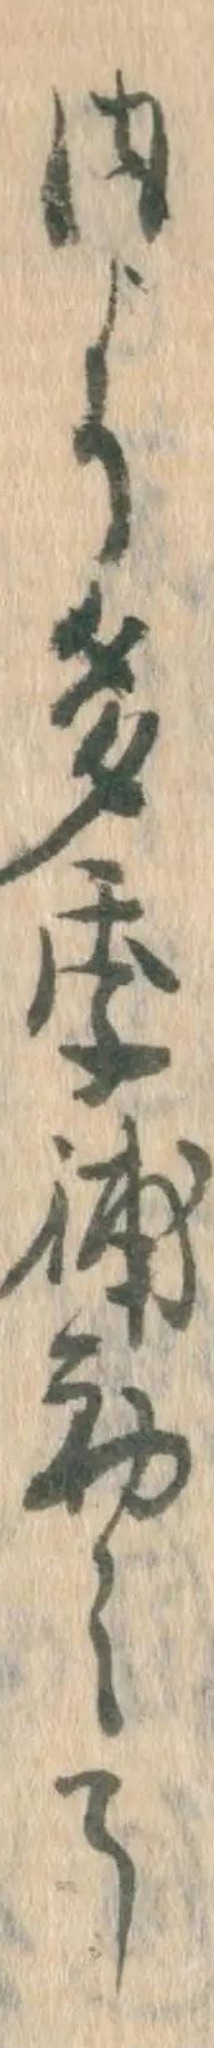内より多季補勤之事、
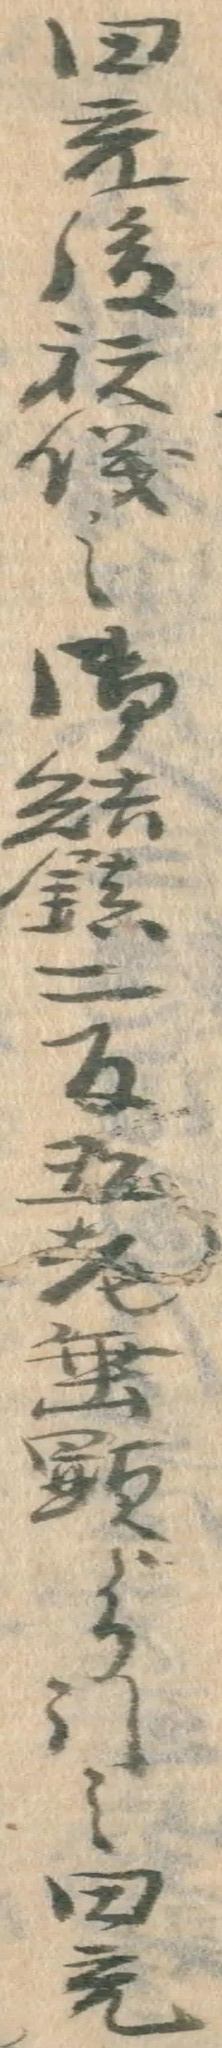田充後祝儀之御結鎮二反九巻、垂顕より引之、田充
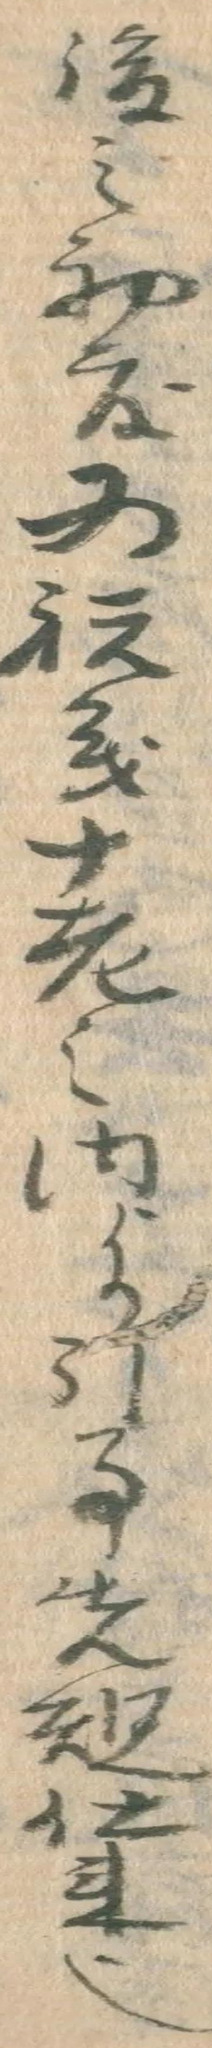後之初度為祝義、十老之内より引事、先規仕来也、
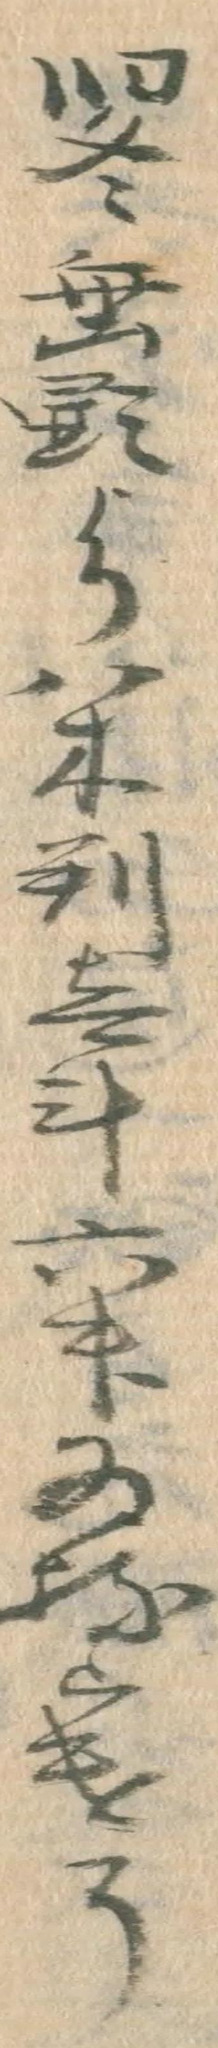旧冬垂顕より米判壱斗六升為持遣了、
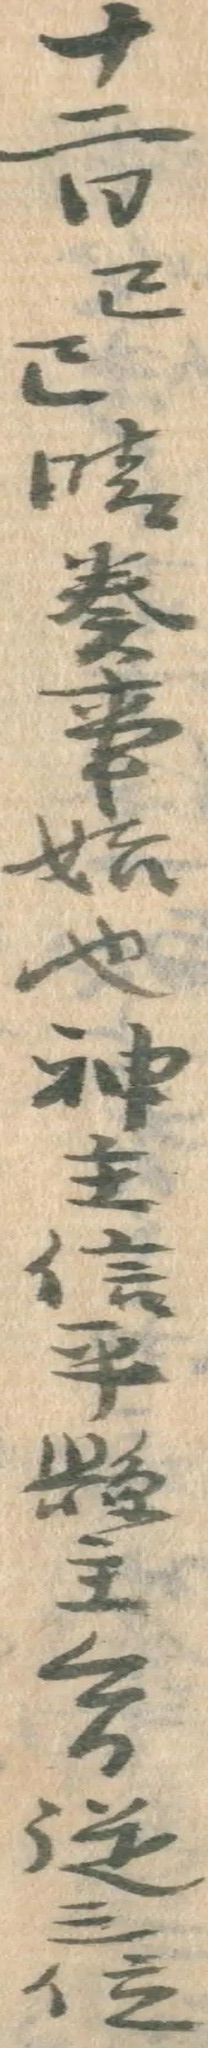十二日己巳晴、奏事始也、神主信平県主、今日従三位
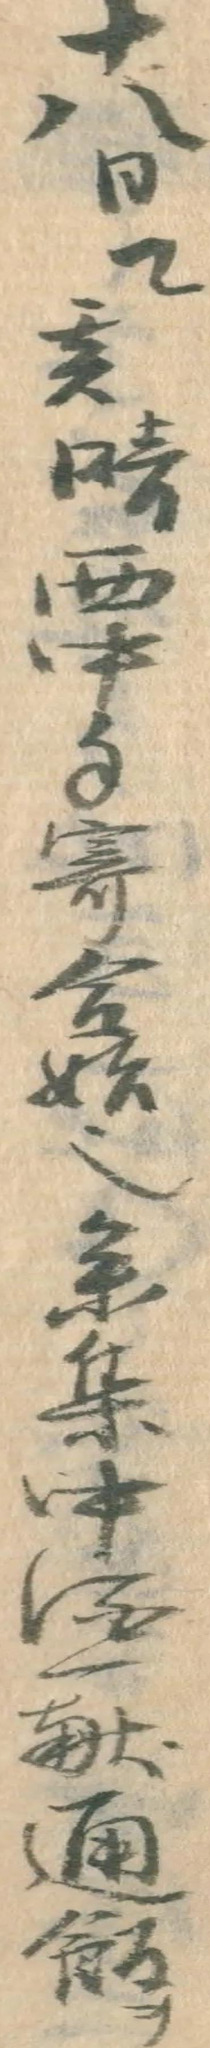十八日乙亥晴、西中手寄合始也、参集中酒一献通、飯ヲ

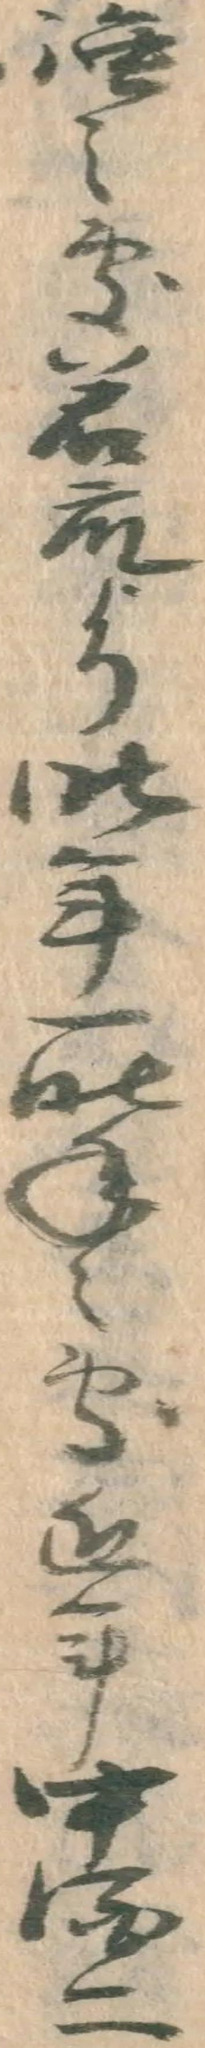強之処、若衆より昨年・一昨年之処、近年中酒二
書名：賀茂社記録. 第63冊
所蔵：国立国会図書館 National Diet Library, JAPAN
